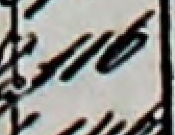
116
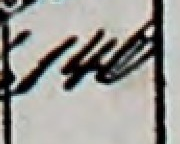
146
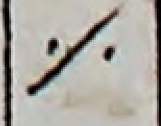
./.
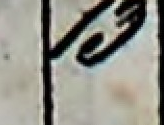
13
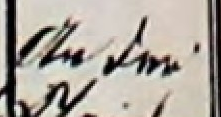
An der
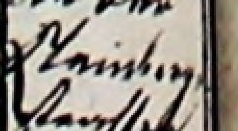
Steinberg„
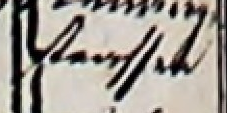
strasse
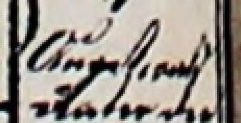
Auges???
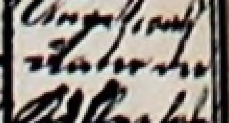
unter der
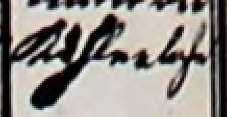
???
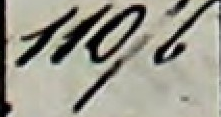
110/b
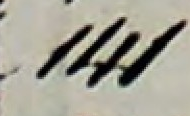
141
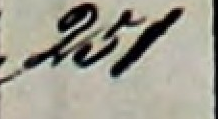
251
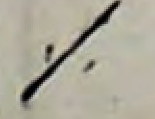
./.
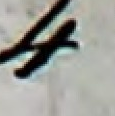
4
